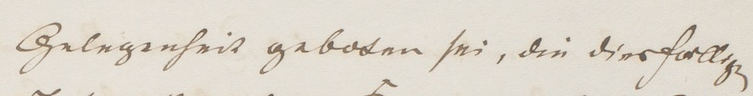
Gelegenheit geboten sei, die diesfalligen
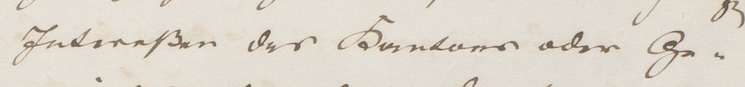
Intereßen des Kantons oder Ge-
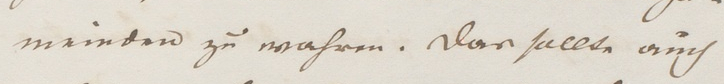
meinden zu wahren. Das sollte auch
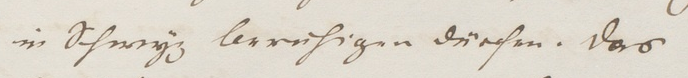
in Schwyz beruhigen dürfen. Das
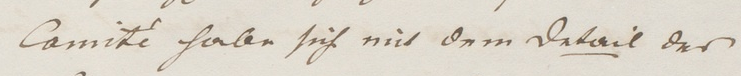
Comité habe sich mit dem Detail des
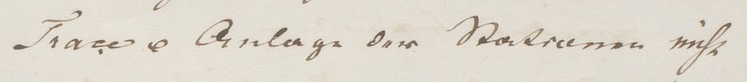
Trace & Anlage der Stationen nicht
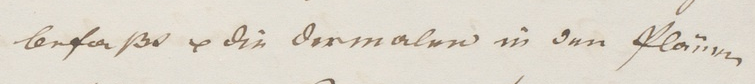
befaß & die dermalen in den Plänen
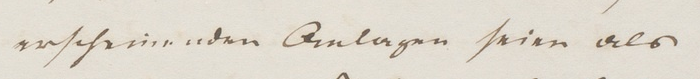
erscheinenden Anlagen seien als
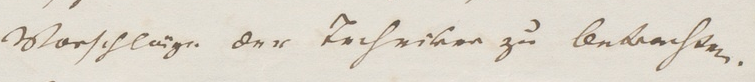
Vorschläge der Techniker zu betrachten.
